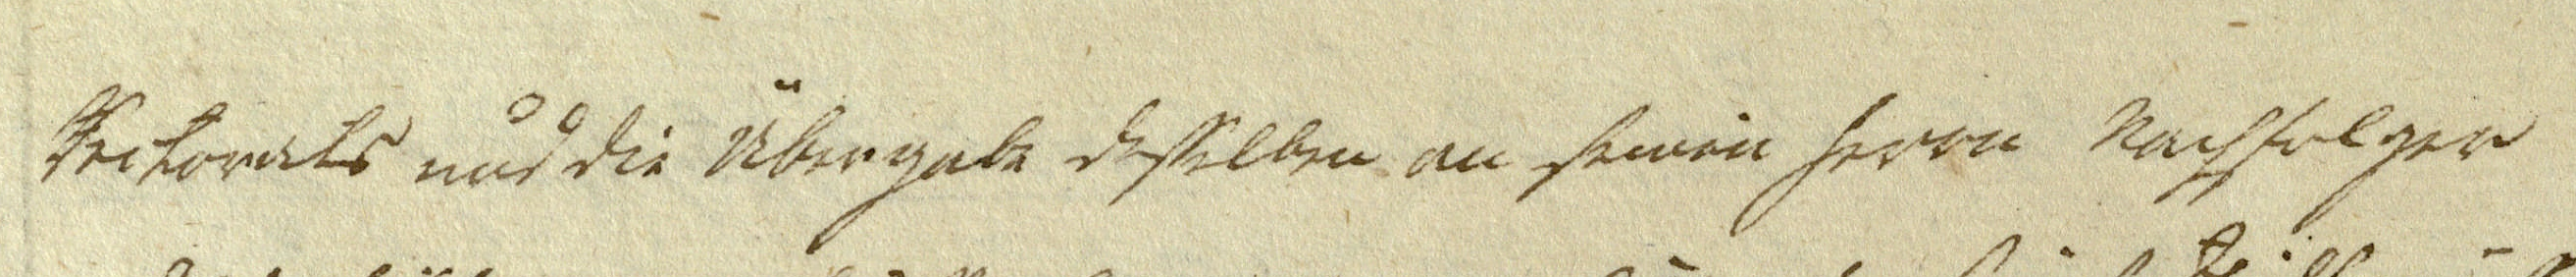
Rectorats und die Übergabe desselben an seinen Herrn Nachfolger
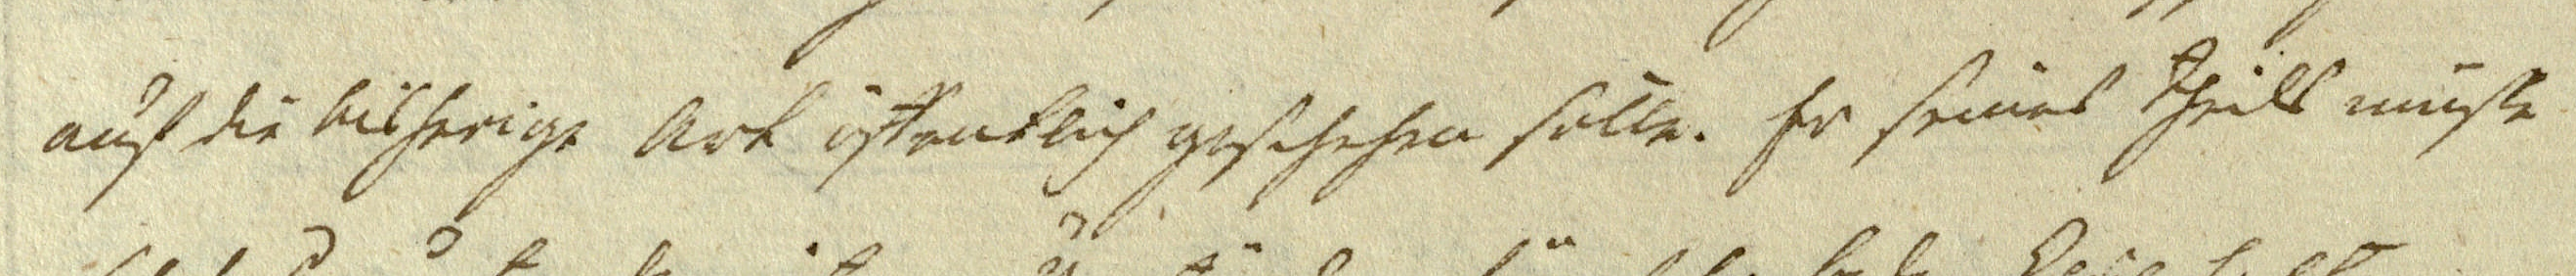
auf die bisherige Art öffentlich geschehen solle. Er seines Theils müsse
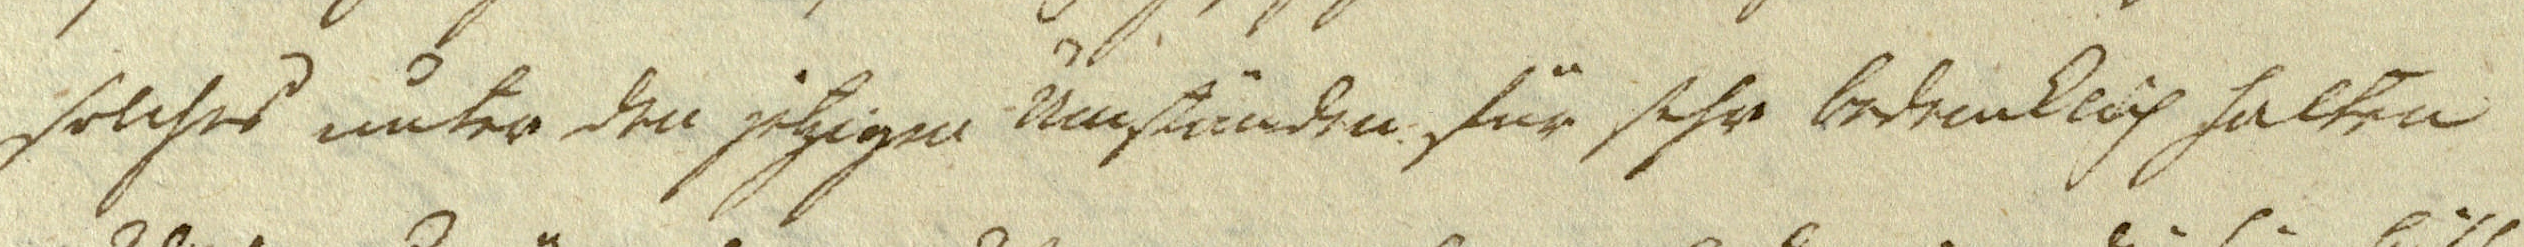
solches unter den jetzigen Umständen für sehr bedenklich halten
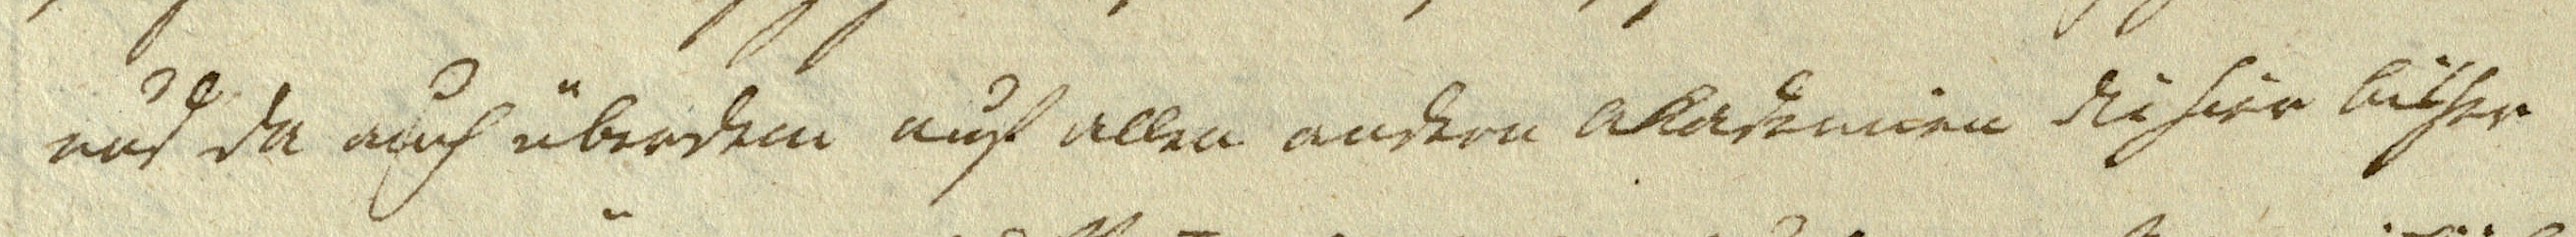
und da auch überdem auf allen andern Akademien die hier bisher
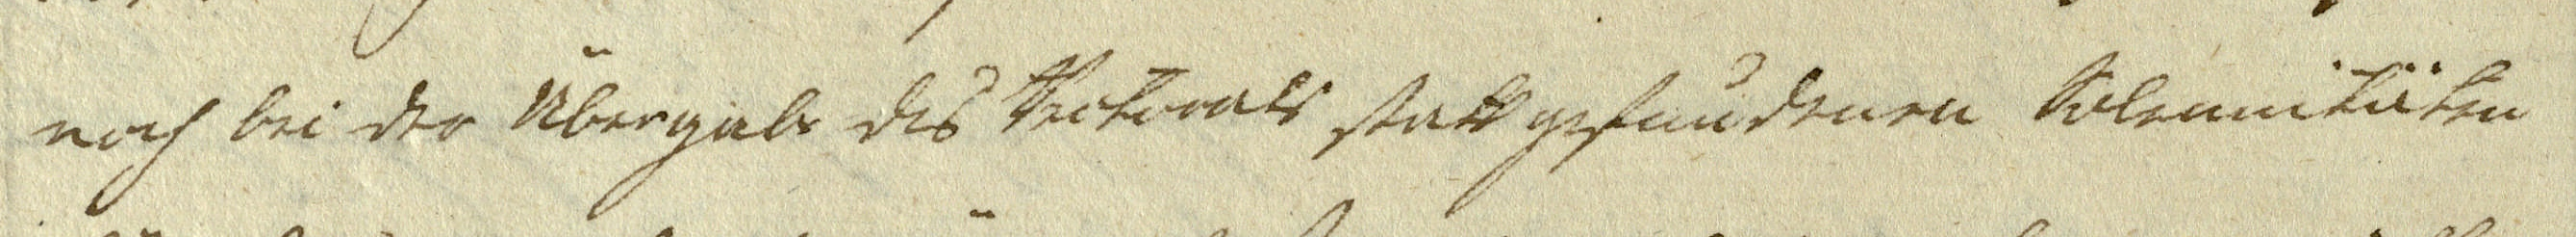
noch bei der Übergabe des Rectorats statt gefundenen Solennitäten
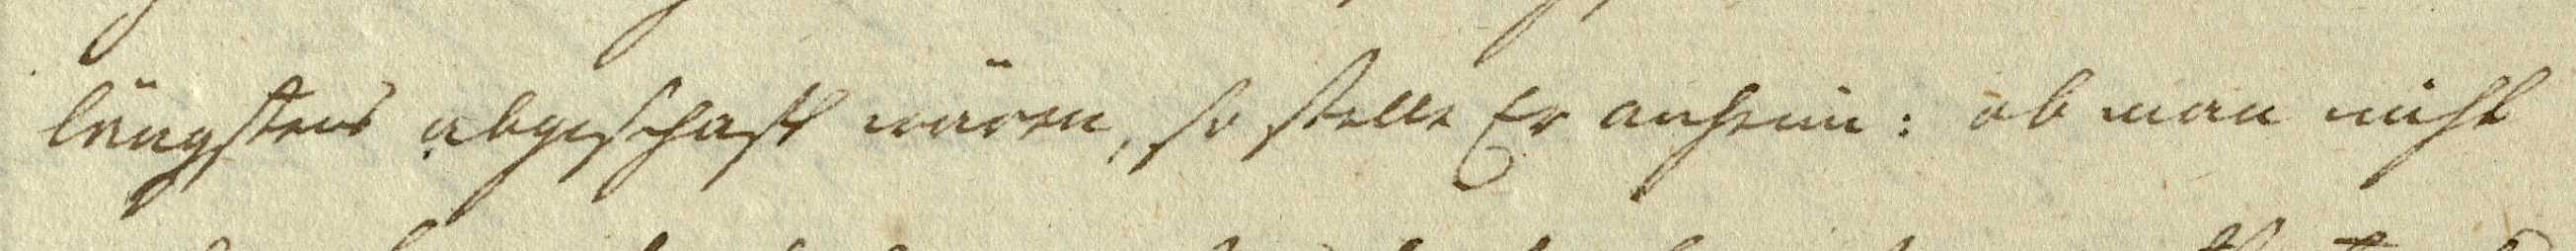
längstens abgeschaft wären, so stelle Er anheim: ob man nicht
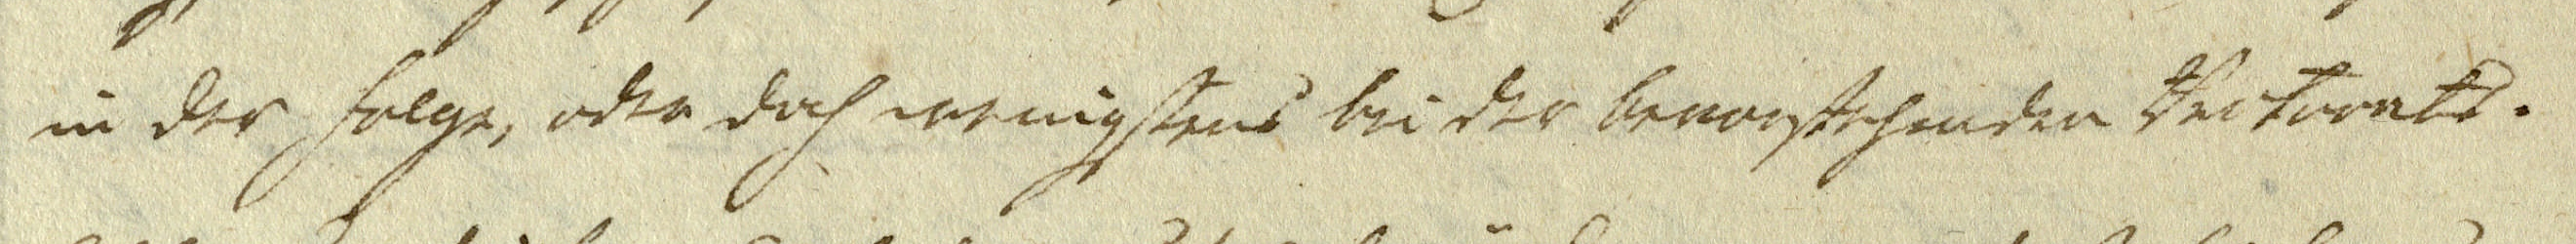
in der Folge, oder doch wenigstens bei der bevorstehenden Rectorats¬
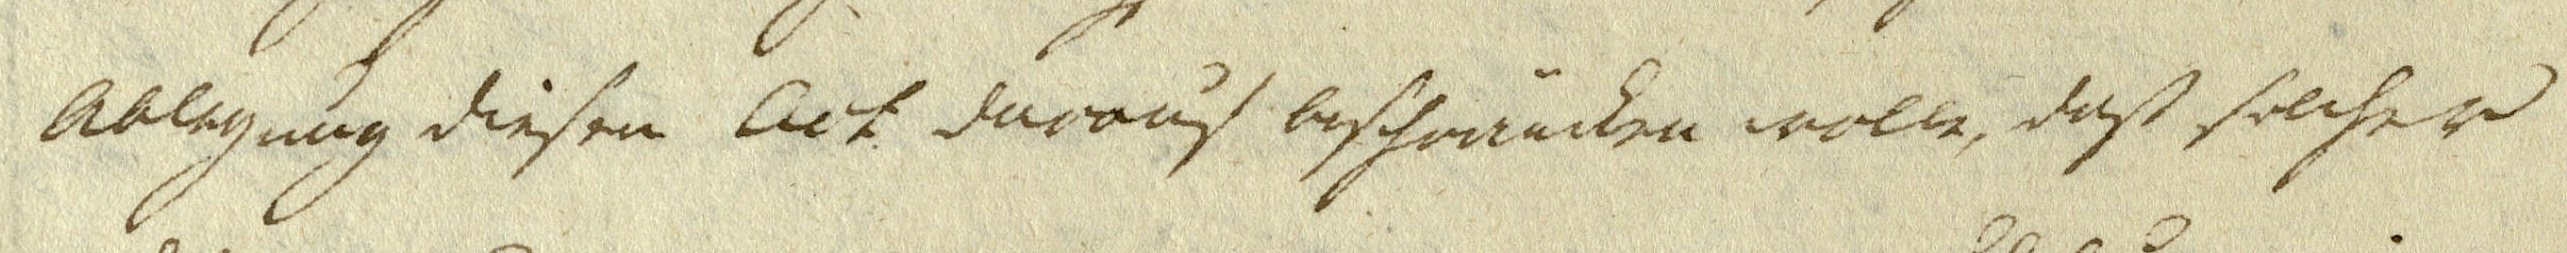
Ablegung diesen Act darauf beschränken wolle, daß solcher
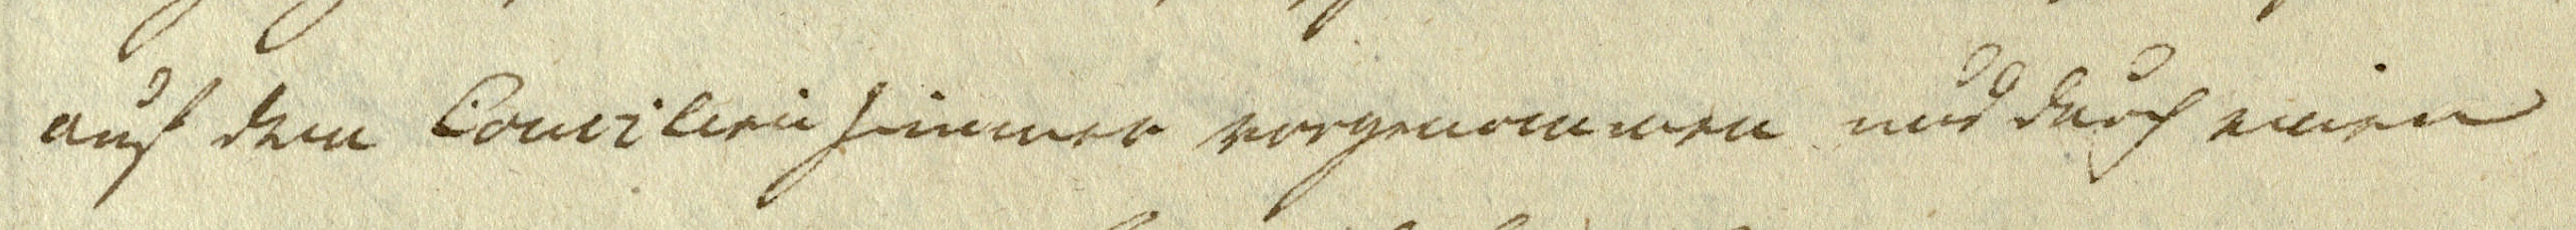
auf dem Concilienzimmer vorgenommen und durch einen
